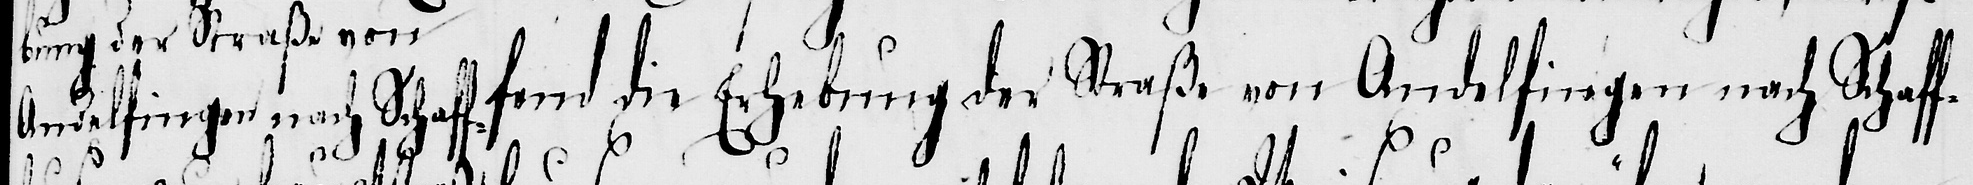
Antrages, betreffend die Erhebung der Straße von Andelfingen nach Schaff¬
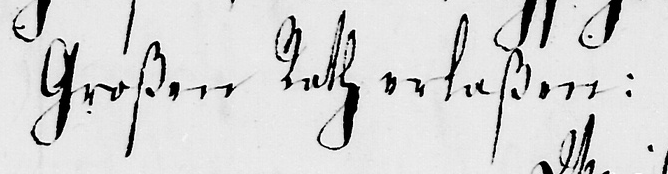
Großen Rath erlaßen:
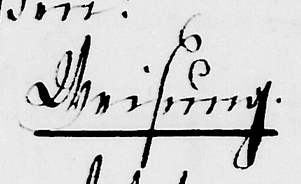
Weisung.
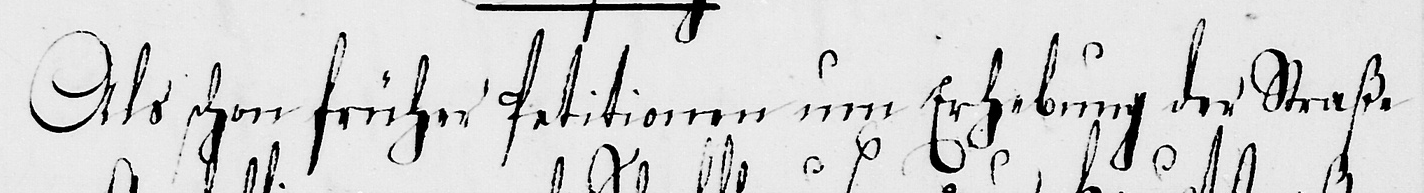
Als schon früher Petitionen um Erhebung der Straße
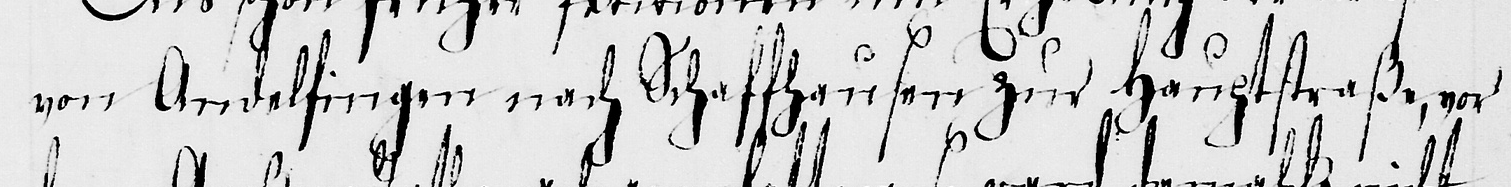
von Andelfingen nach Schaffhausen zur Hauptstraße, vor
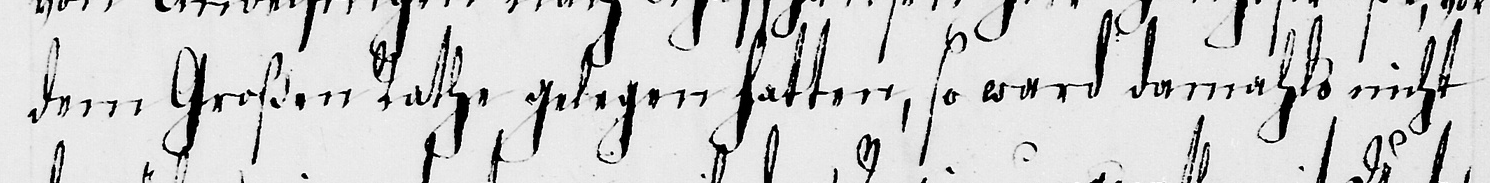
dem Großen Rathe gelegen hatten, so ward damahls nicht
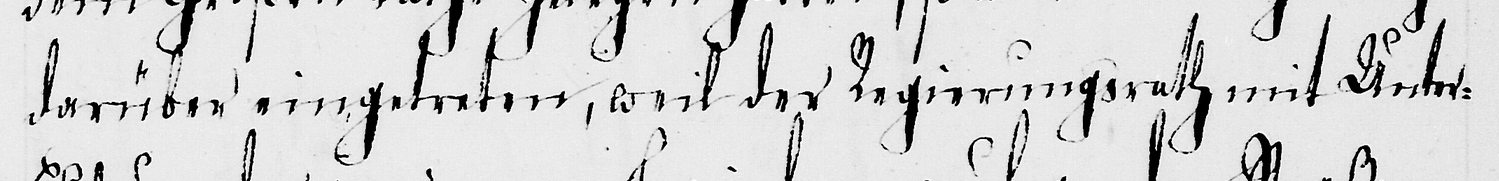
darüber eingetreten, weil der Regierungsrath mit Unter¬
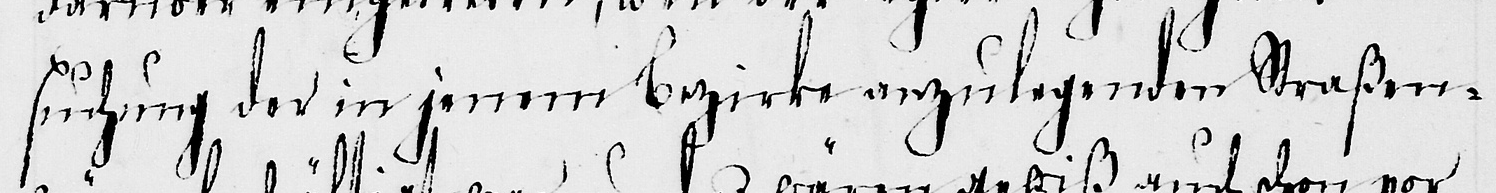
suchung der in jenem Bezirke anzulegenden Straßen¬
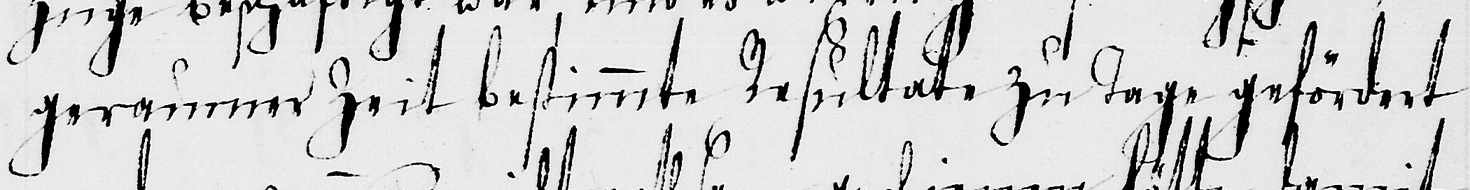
geraumer Zeit bestimmte Resultate zu Tage gefördert
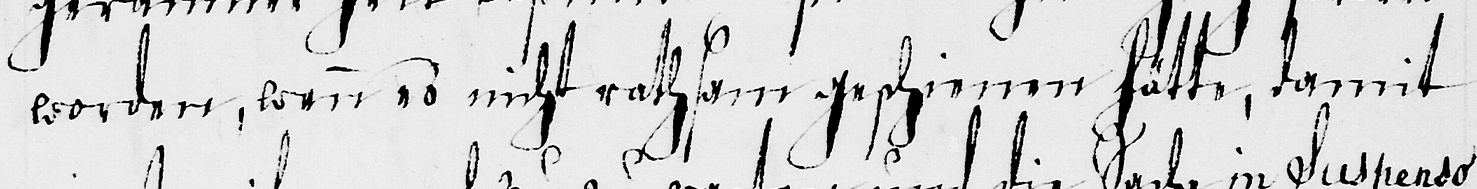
worden, wenn es nicht rathsam geschienen hätte, damit
